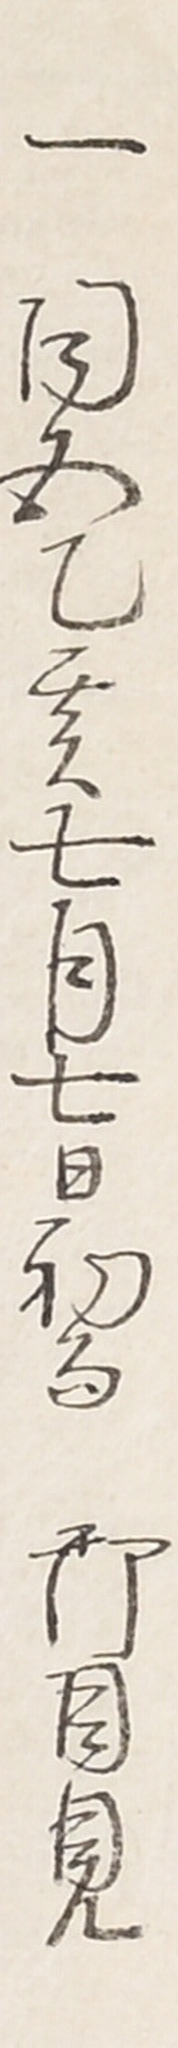一同五乙亥七月七日初而御目見
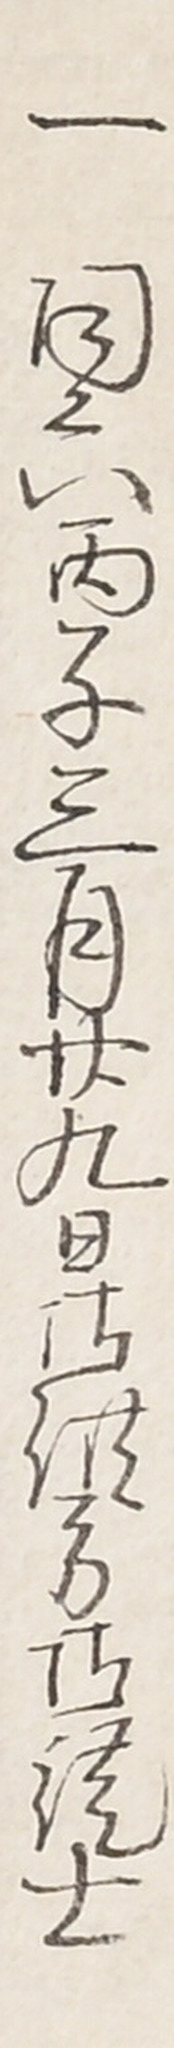一同六丙子三月ニ十九日御供方御徒士
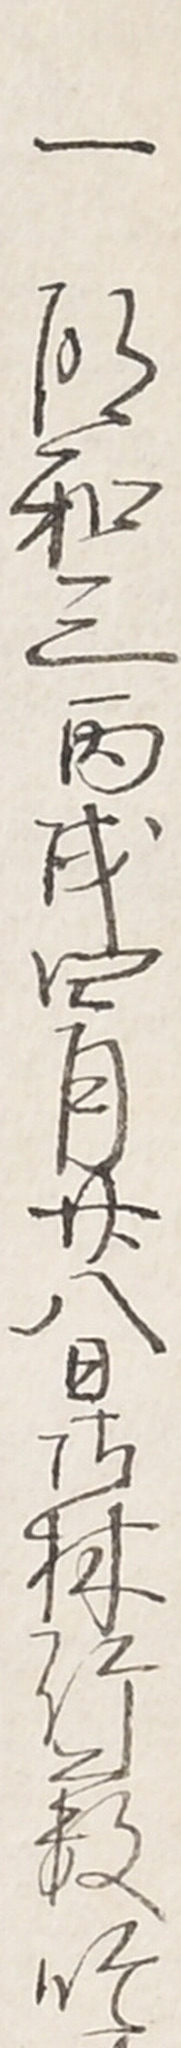一明和三丙戌四月廿八日御林竹藪吟味役被
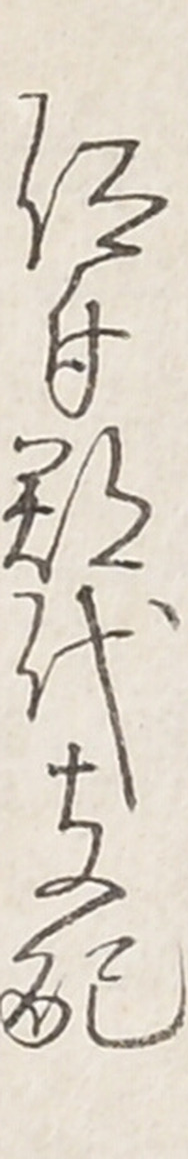仰付郡代支配
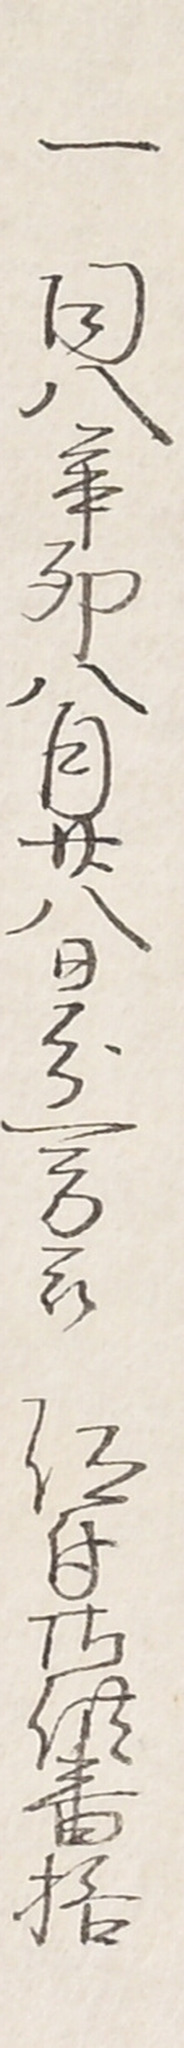一同八辛卯八月廿八日分一方被仰付御供番格
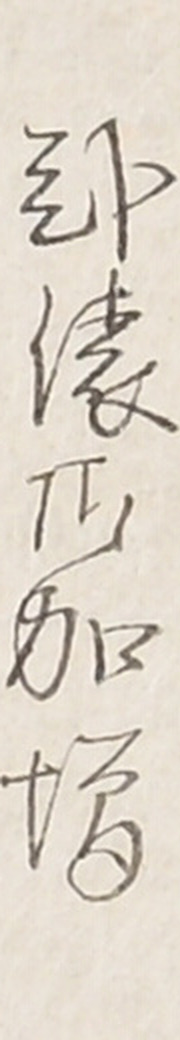弐俵御加増
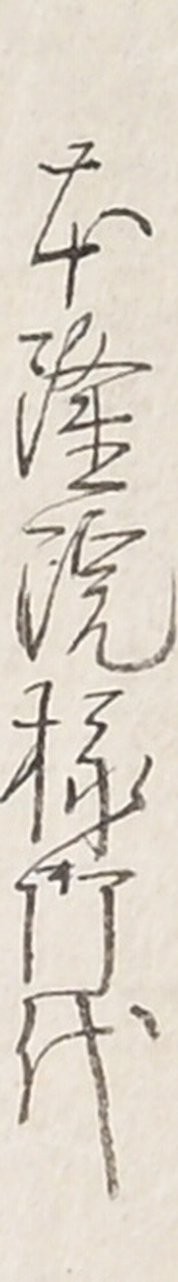本隆院様御代
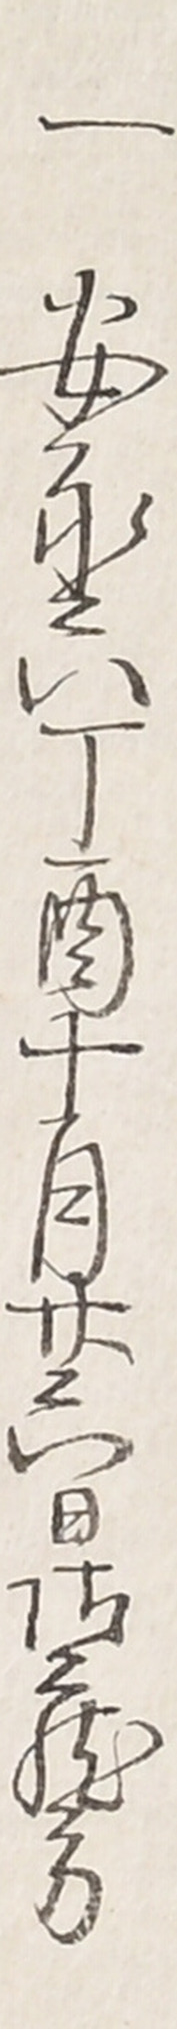一安永六丁酉十月廿六日御蔵方
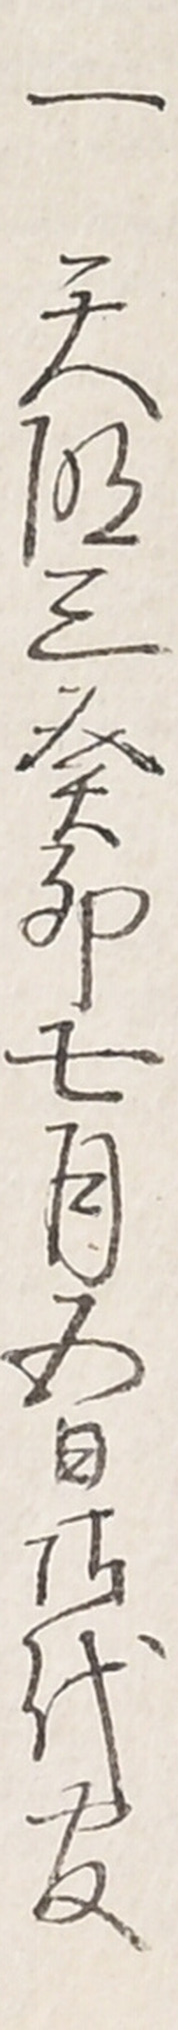一天明三癸卯七月五日御代官
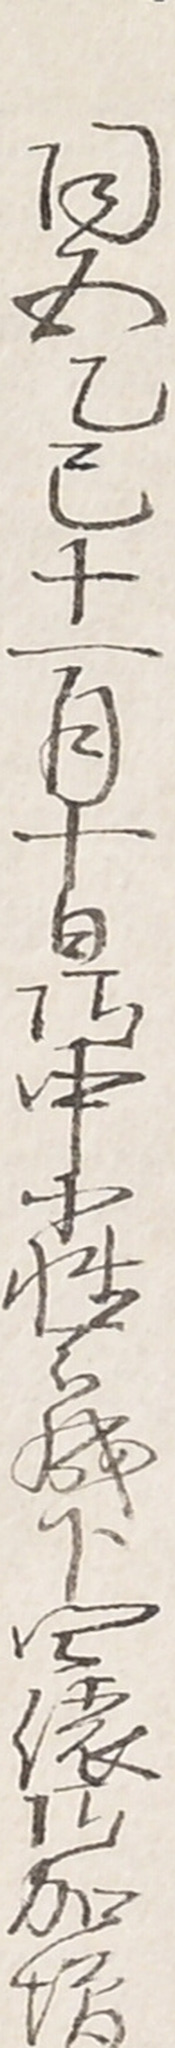一同五乙巳十一月十日御中小性被成下四俵御加増
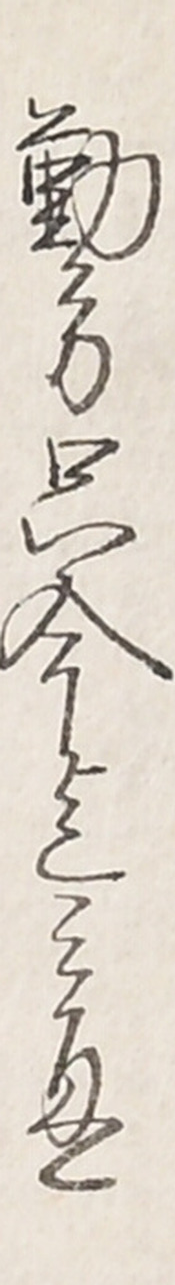勤方只今迄之通
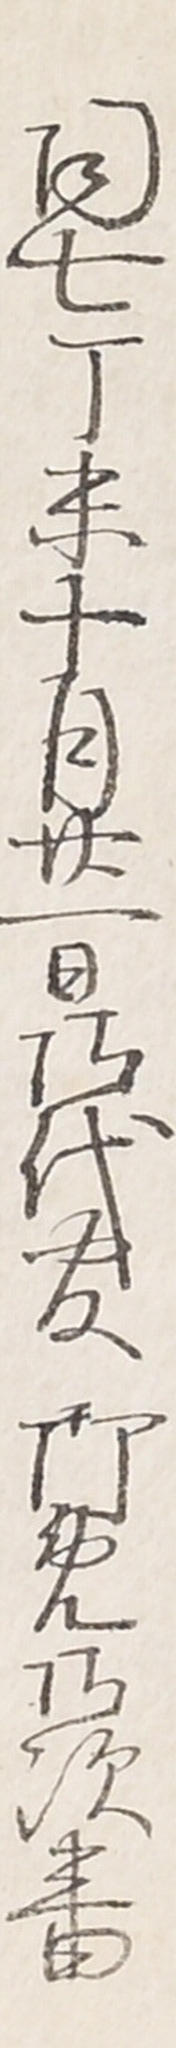一同七丁未十月廿一日御代官御免御次番
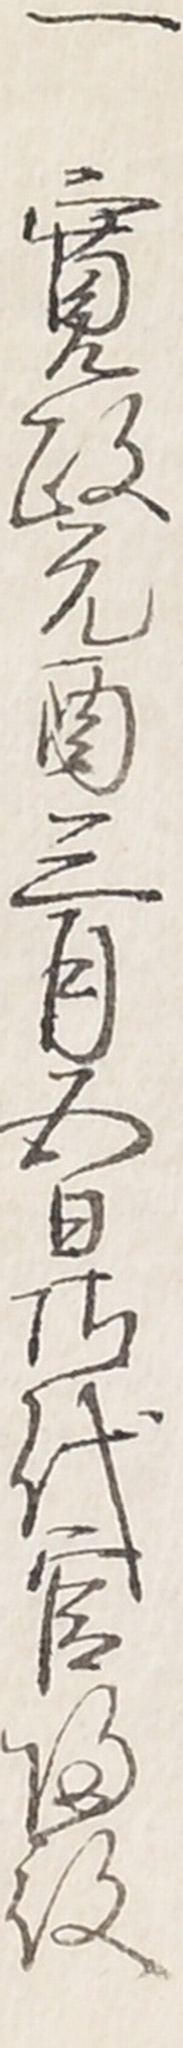一寛政元酉三月五日御代官帰役
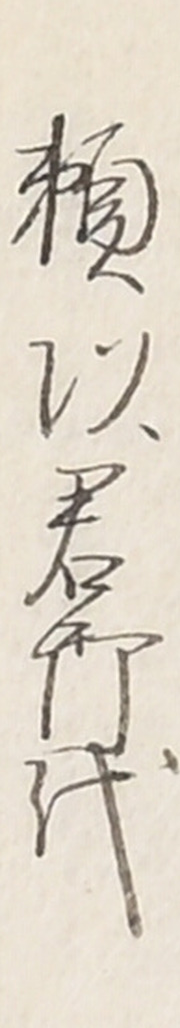頼以君御代
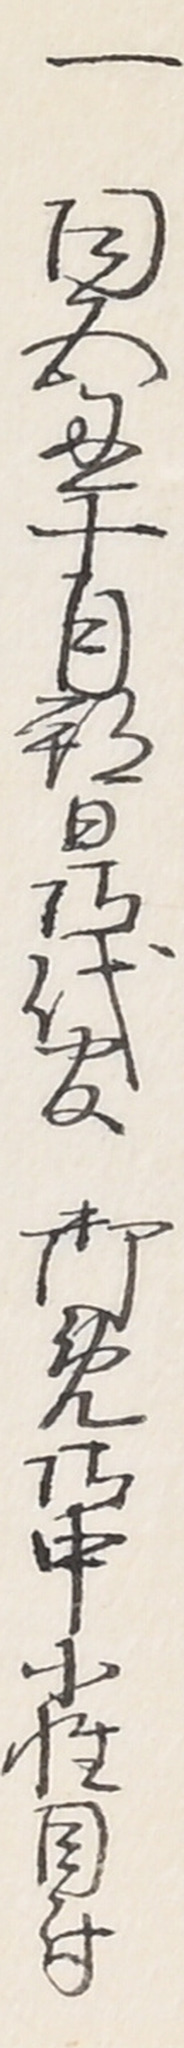一同五丑十月朔日御代官御免御中小性目付
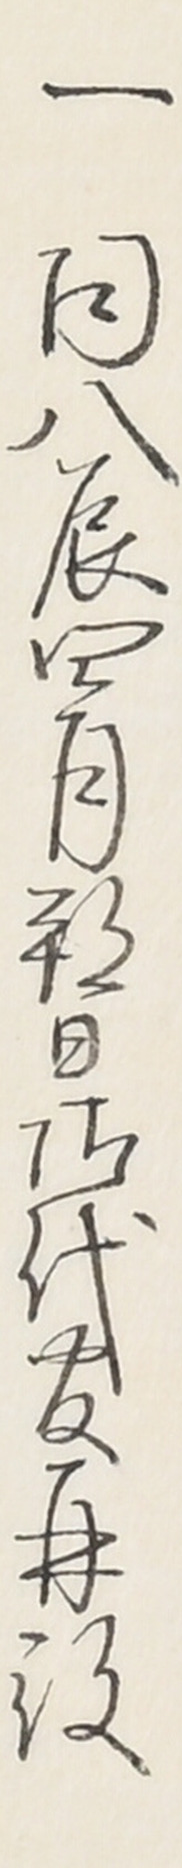一同八辰四月朔日御代官再役
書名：無足諸士勤仕録（四）
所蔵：伊那市立高遠町図書館・合同会社AMANE
